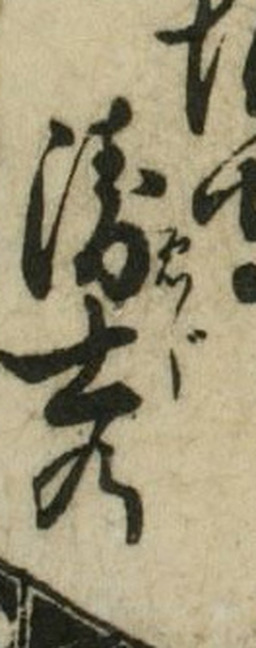衛士の
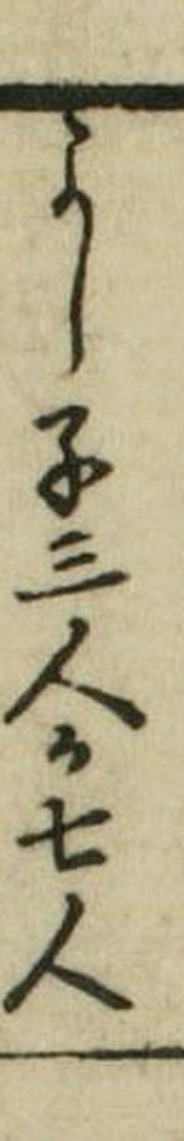よし子三人か七人
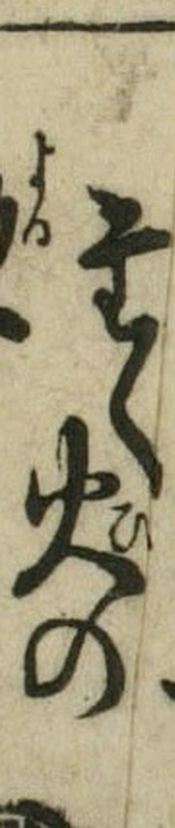たく火の
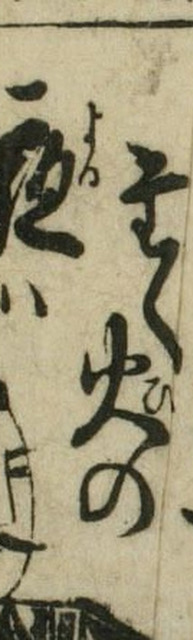たく火の
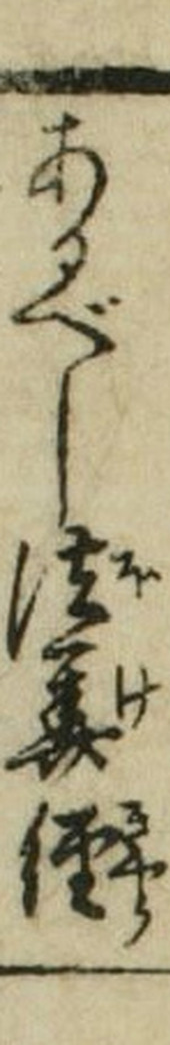あるべし法華経
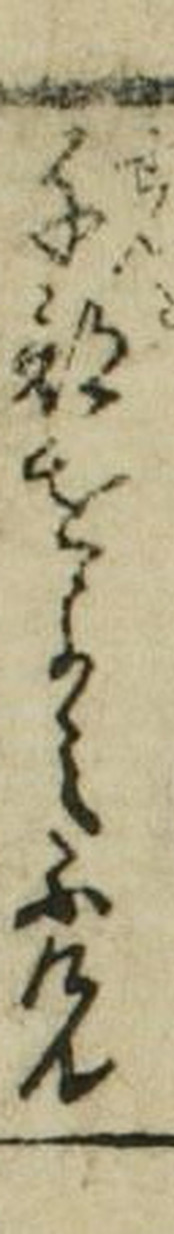千部をよみふけん
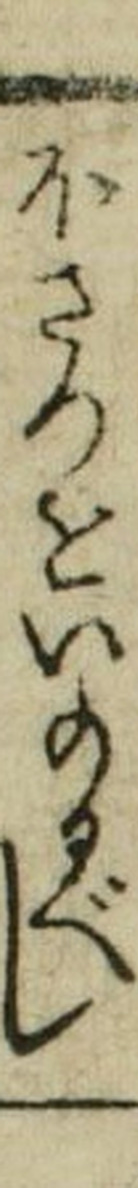ほさつをいのるべし
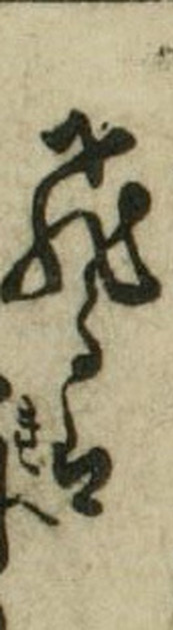ひるは
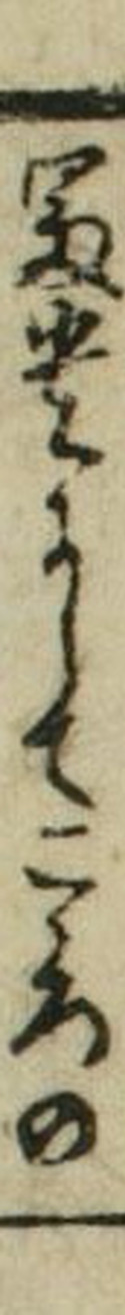富貴にしてこゝろの
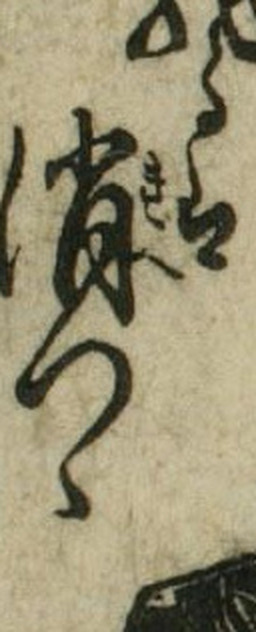消つゝ
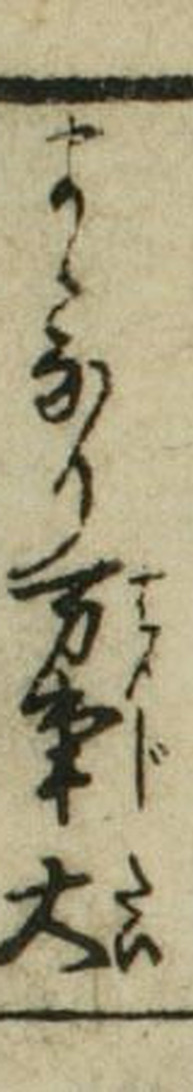まゝなり万事大
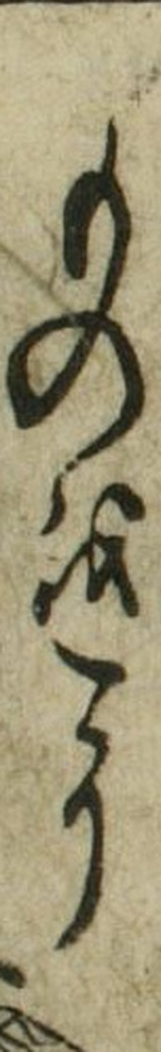ものをこそ
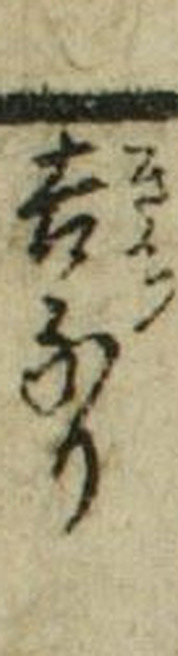吉なり
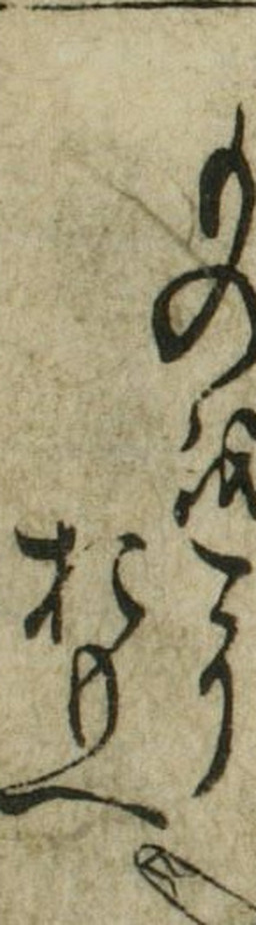おもへ
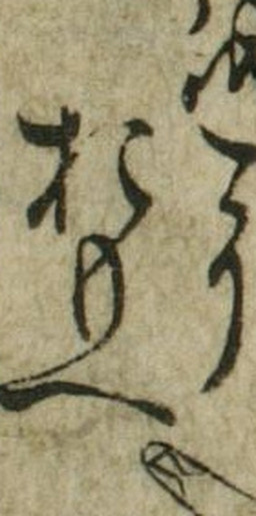おもへ

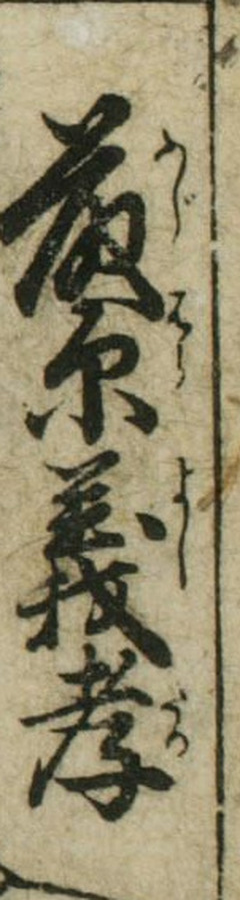藤原義孝
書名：百人一首
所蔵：東京学芸大学教育コンテンツアーカイブ
